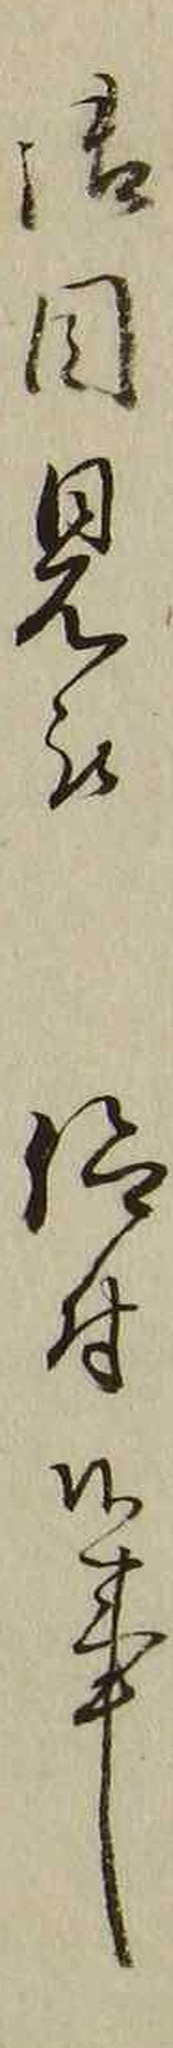御目見被仰付候事
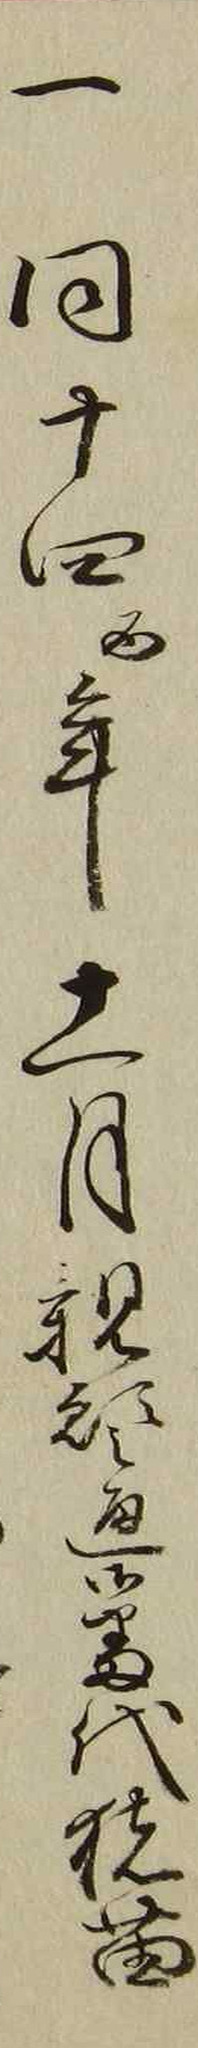一同十四酉年十一月親願の通御番代猪苗
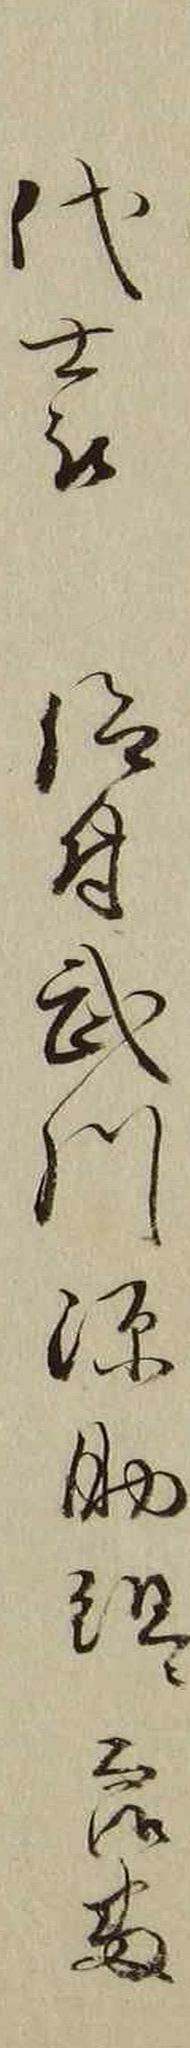代士被仰付武川源助組に而御番
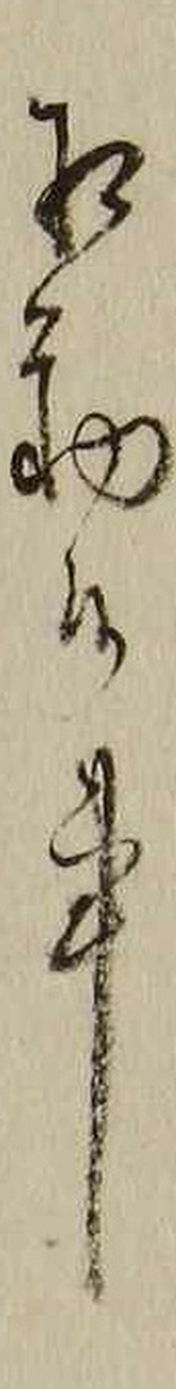相勤候事
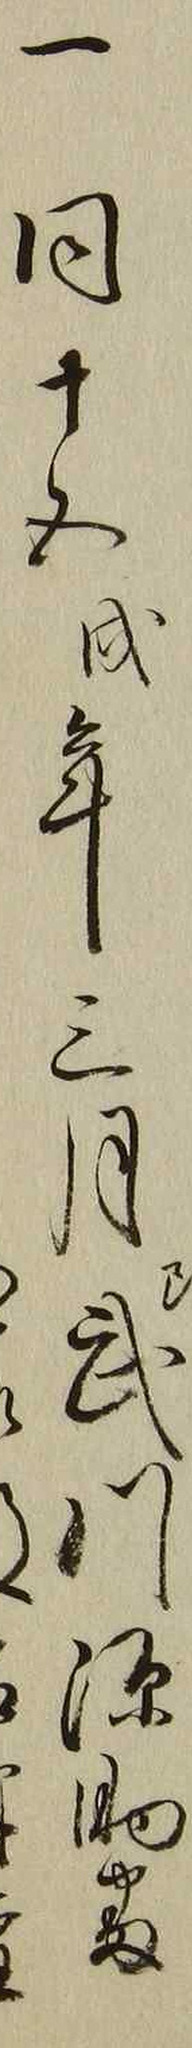一同十五戌年三月頭武川源助番
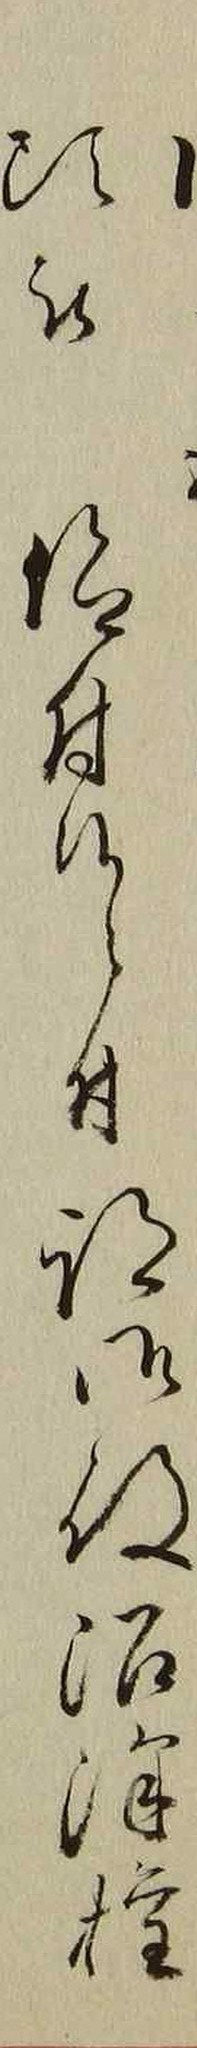頭被仰付候に付跡御役沼津権
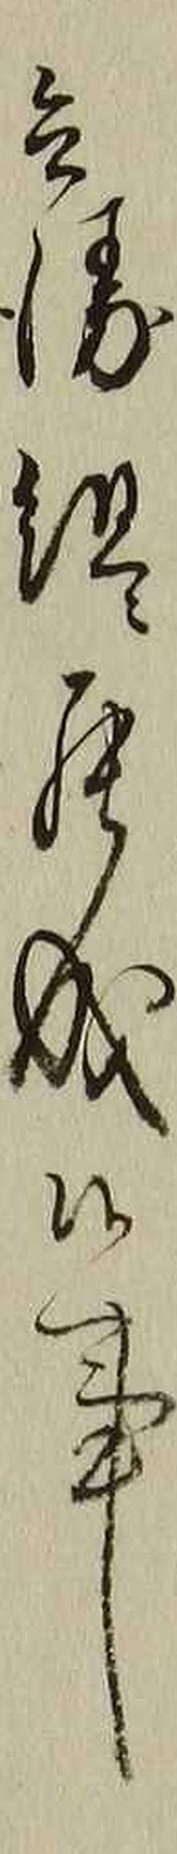兵衛組に罷成候事
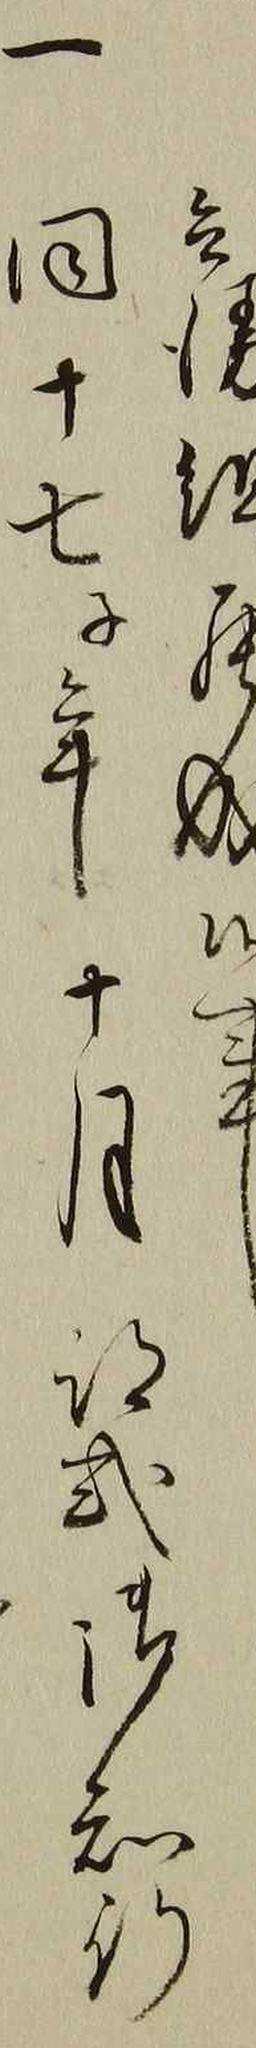一同十七子年十月跡式御知行
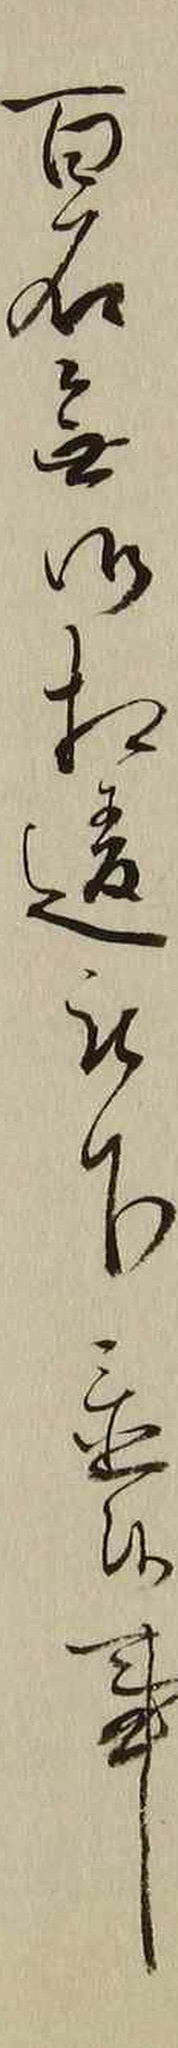百石無御相違被下置候事
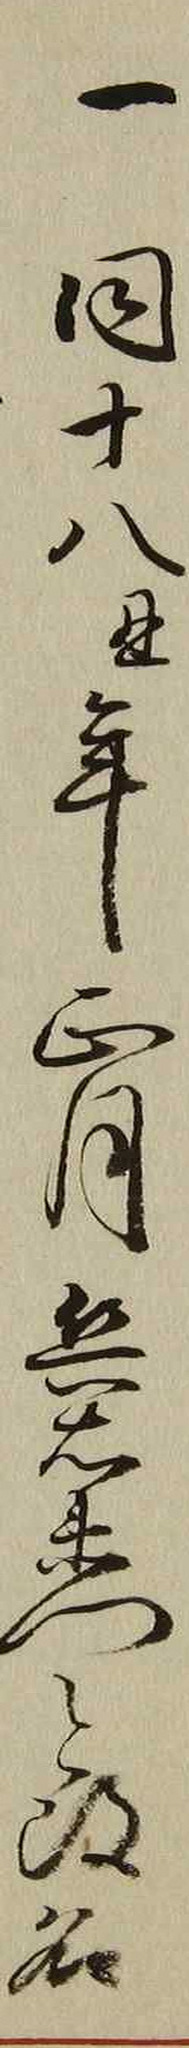一同十八丑年正月兵右衛門と改名
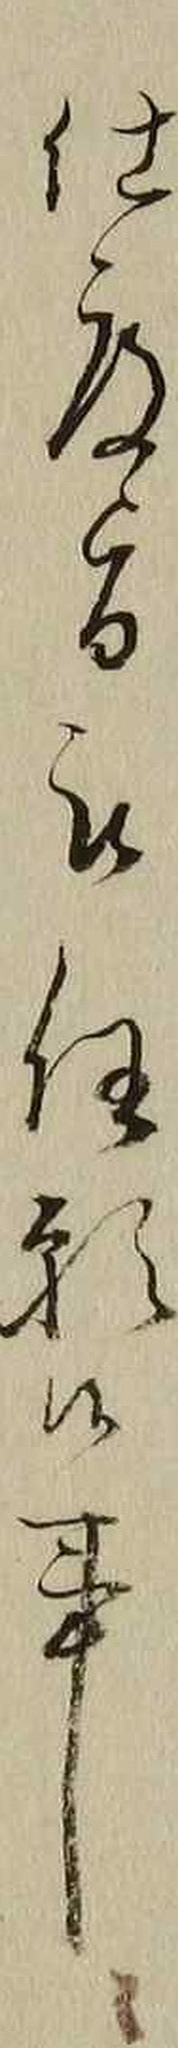仕度旨被任願候事
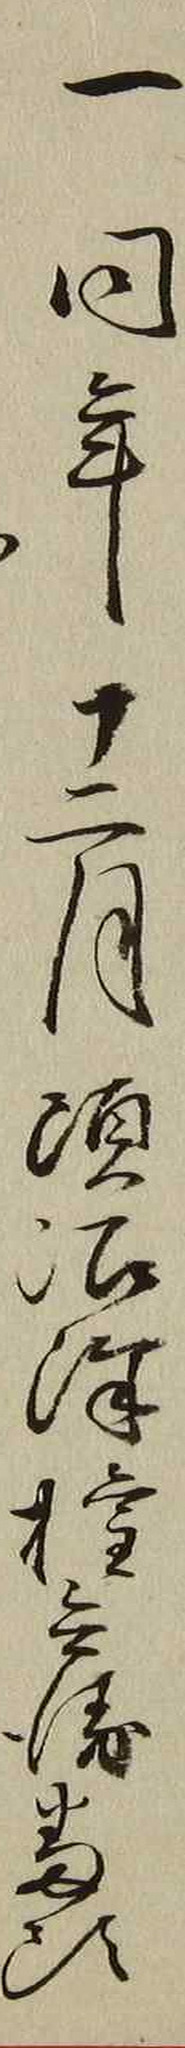一同年十二月頭沼津権兵衛番頭
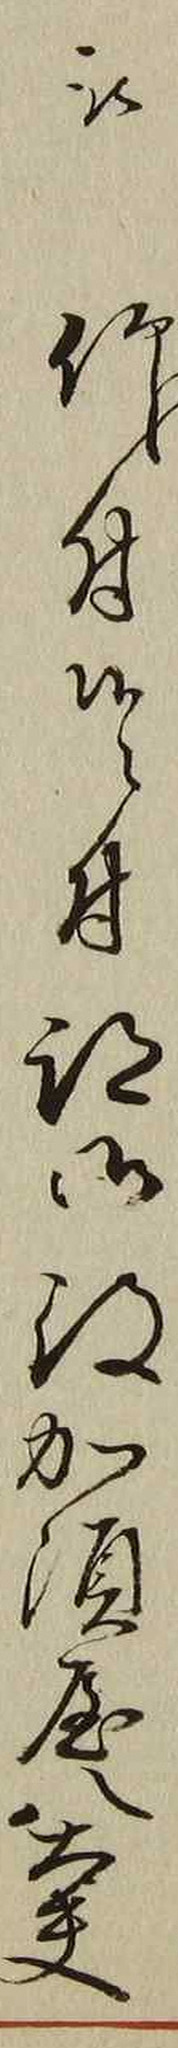被仰付候に付跡御役加須屋八太夫
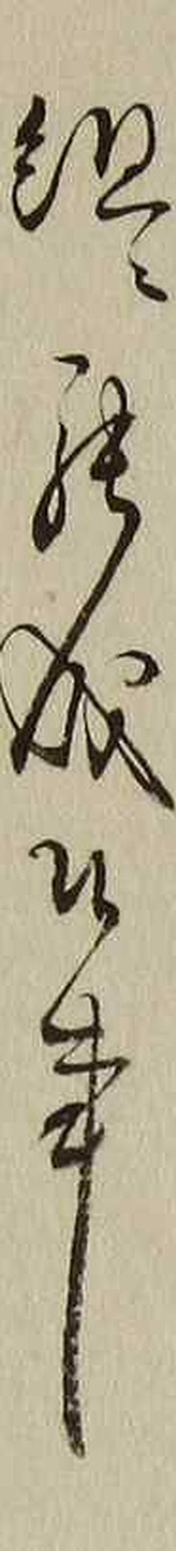組に罷成候事
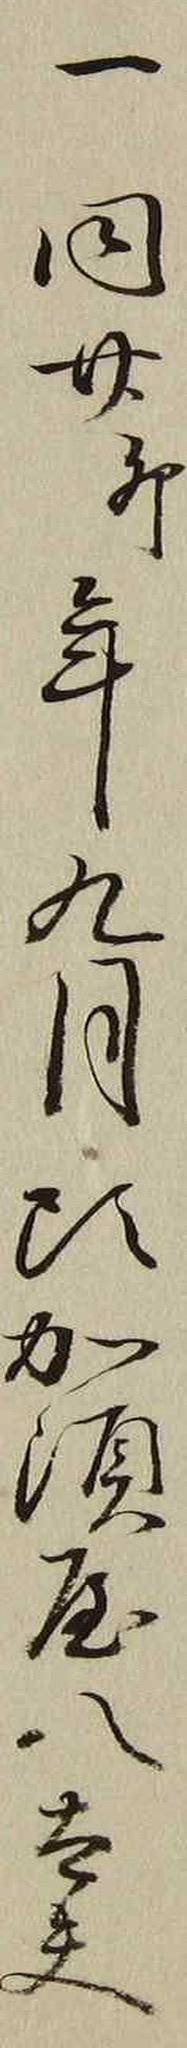一同廿卯年九月頭加須屋八太夫
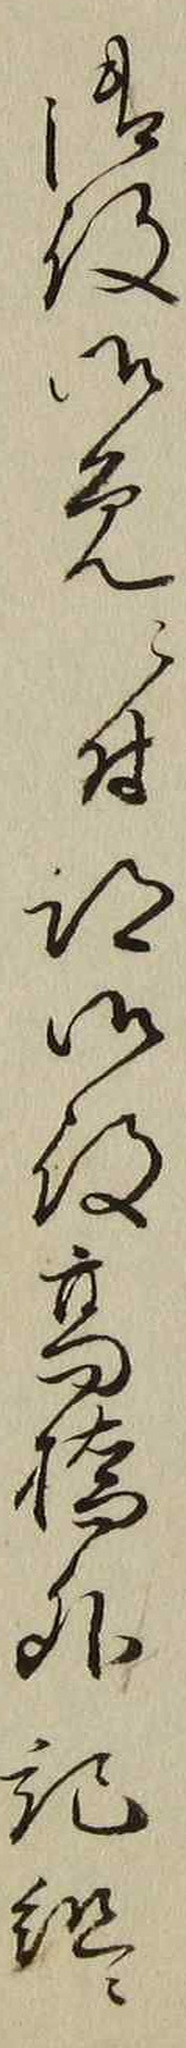御役御免に付跡御役高橋外記組に
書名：諸士系譜　巻之1　い之部1
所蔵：会津若松市立会津図書館
